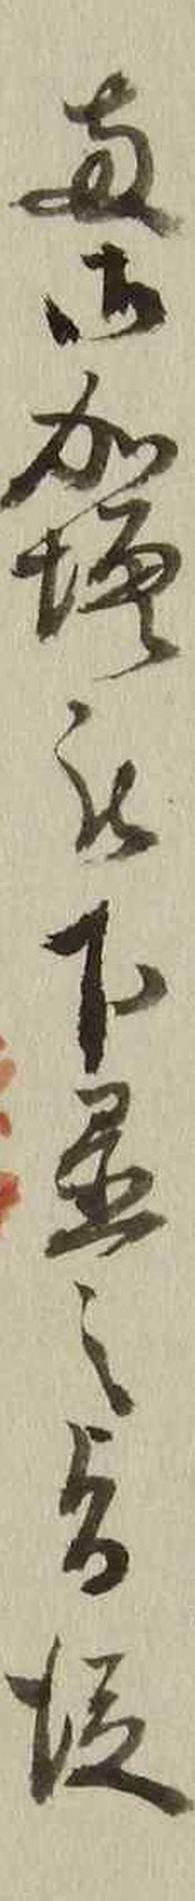両御加増被下置之旨従
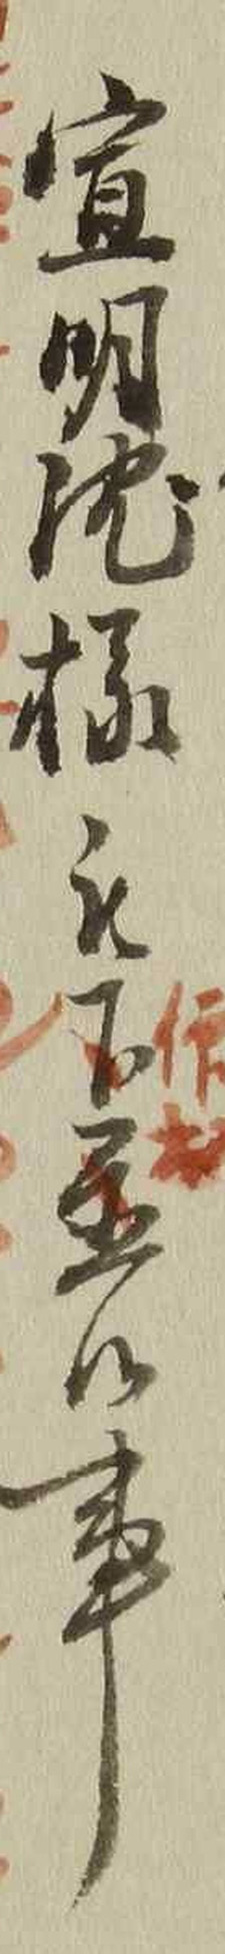宣明院様被下置候事
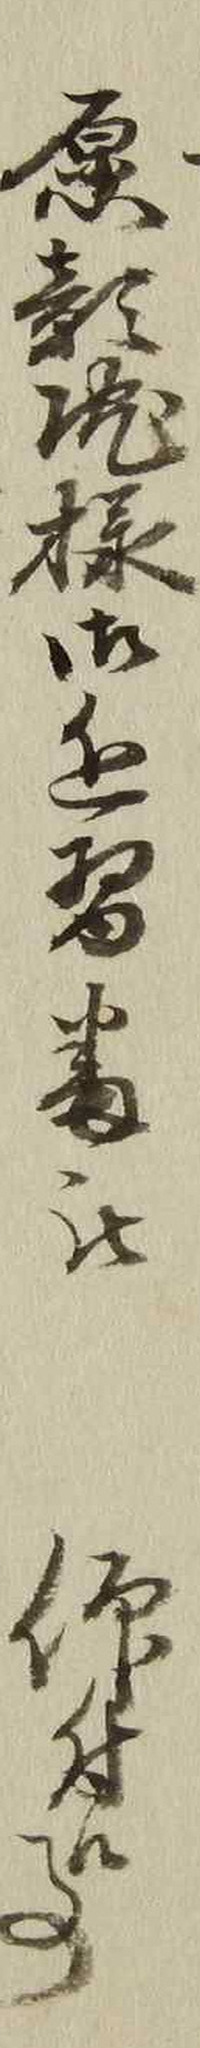宣明院様御近習番被仰付候事
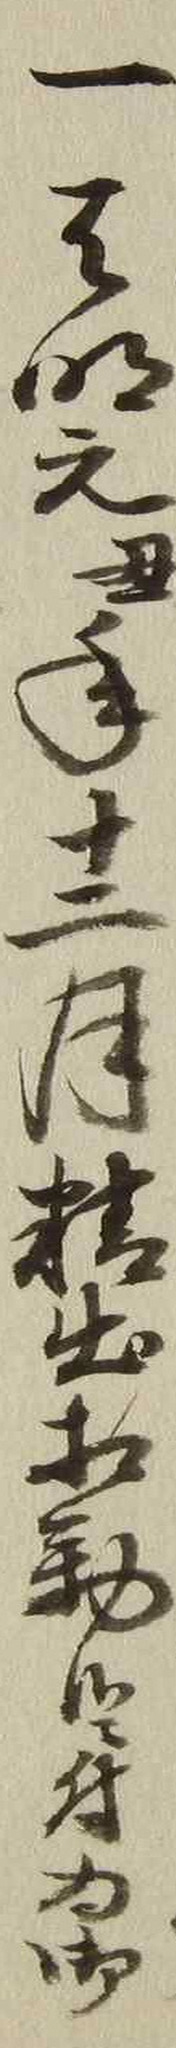一天明元丑年十二月精出相勤候ニ付為御
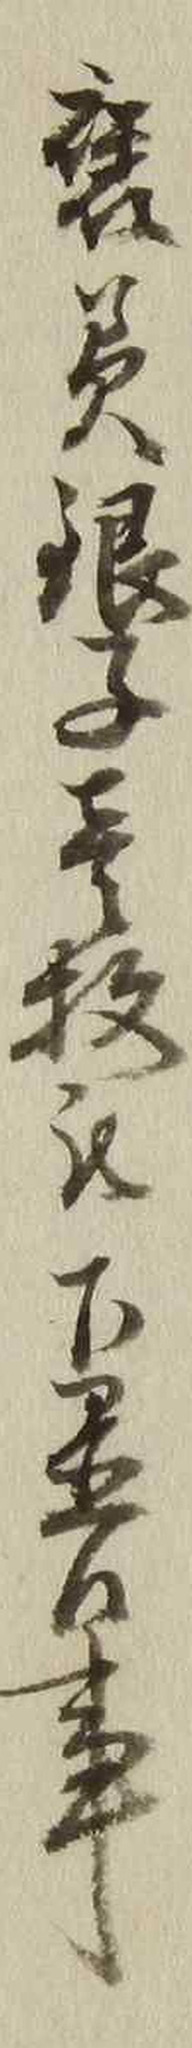褒美銀子壱枚被下置候事
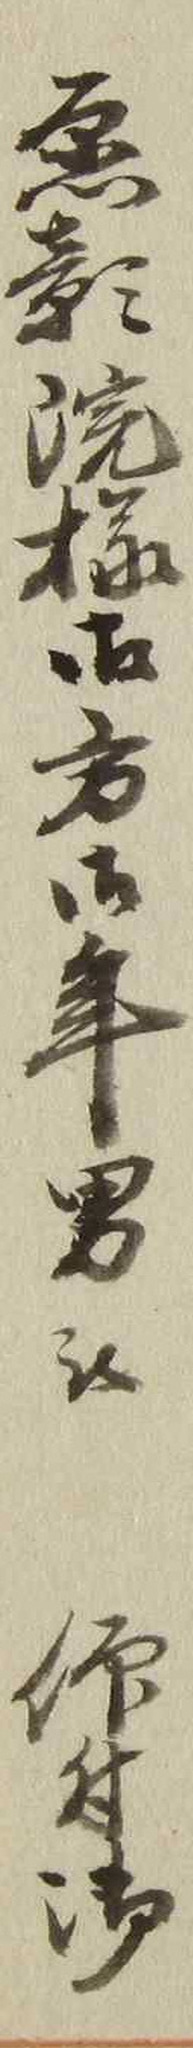愿彰院様御方御年男被仰付御
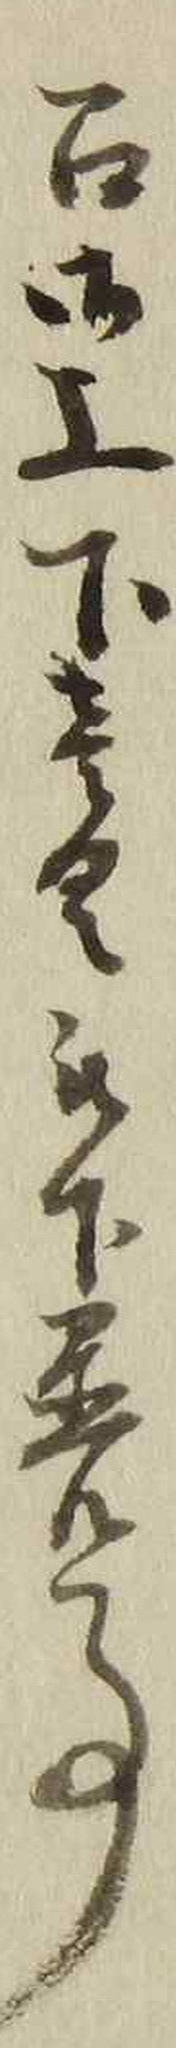召御上下壱具被下置候事
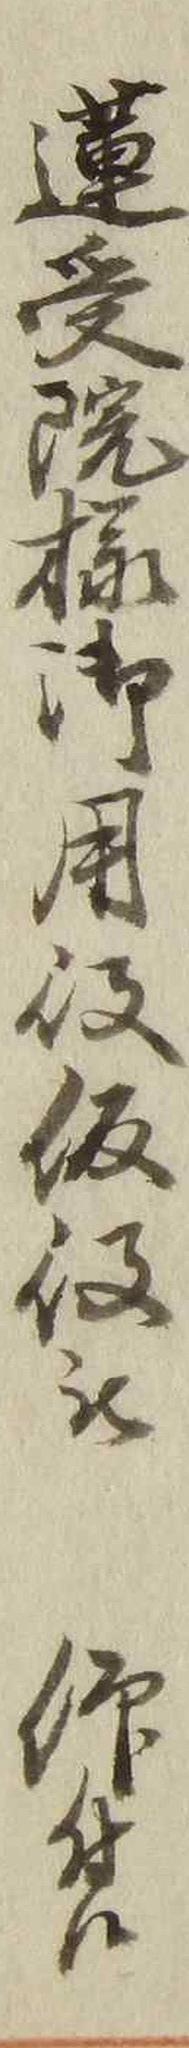蓮受院様御用役仮役被仰付候
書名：諸士系譜　巻之53　に之部4
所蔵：会津若松市立会津図書館
